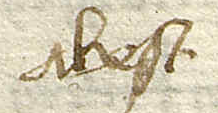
abeſt
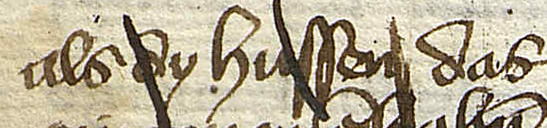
als dy huſſen das
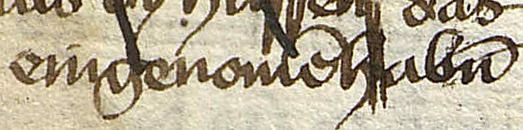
eingenome* hab*n
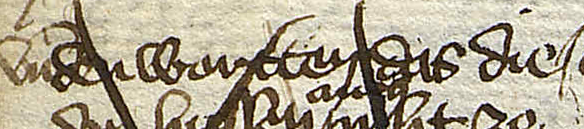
Vn*den wortten das die /
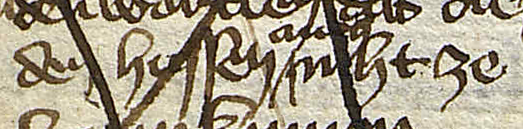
der huſſen niht cʒe
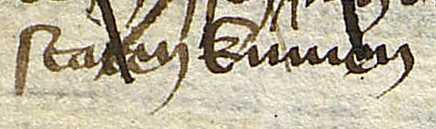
ſtaten kumen
